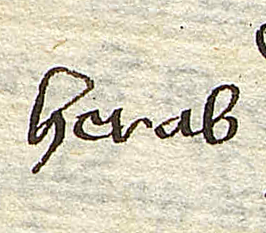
herab
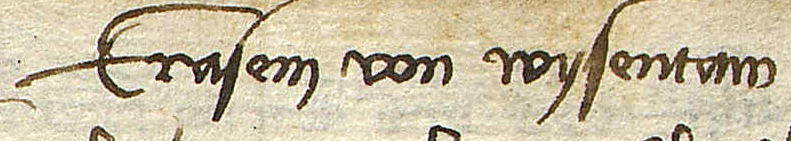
Eraſem von wyſentaw
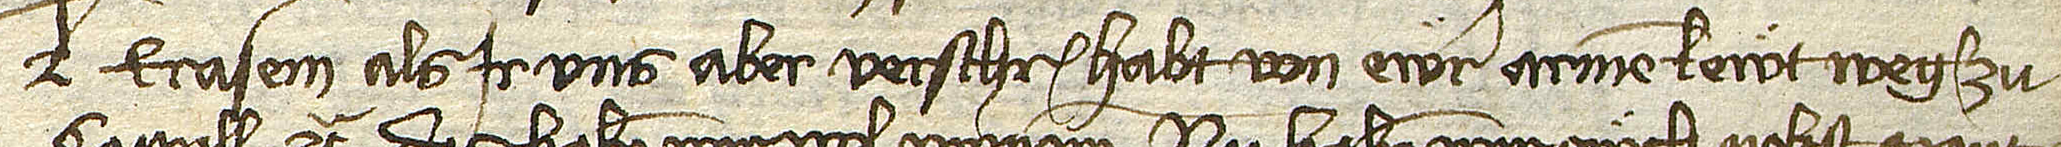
L* Eraſem als Ir vns aber verſchr* hab von ew*r arme* lewt weg* ʒu
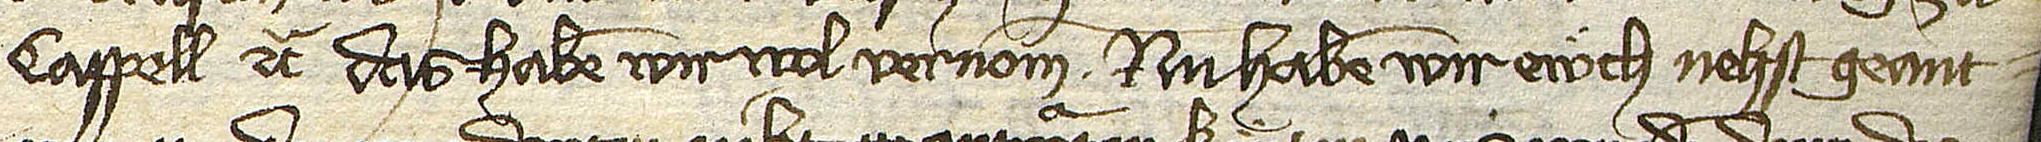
Cappell ec* das habe* wir wol vernom* . Nu habe* wir ewch nehſt geant =
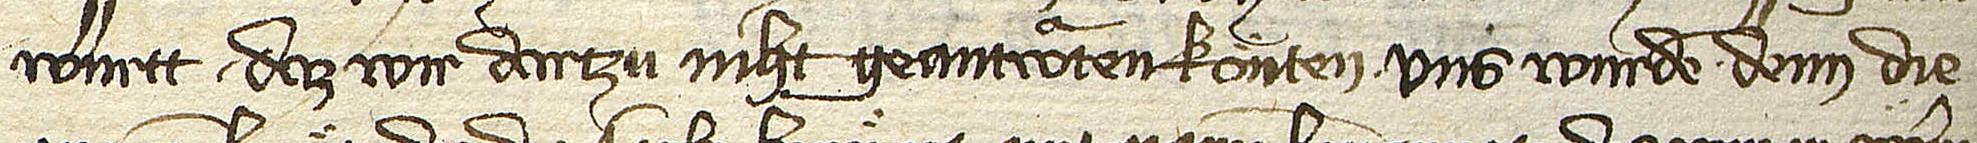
wurtt / daʒ wir darcʒu niht geantw*ten könten . vns wurde* . denn die
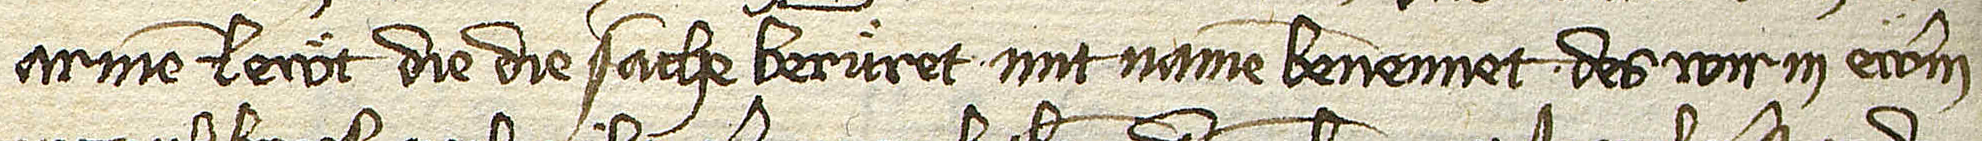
arme* lewt die die ſache berüret mit name* benemet . des wir in ew*m
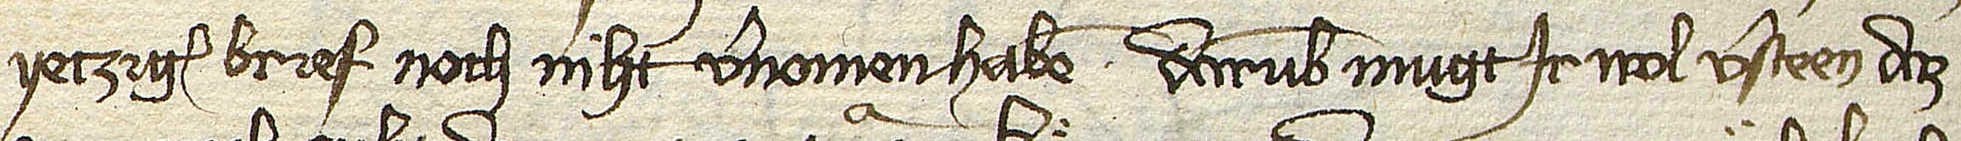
yecʒig* brief noch niht v*nomen habe* . Daru*b mugt Ir wol v*ſteen daʒ
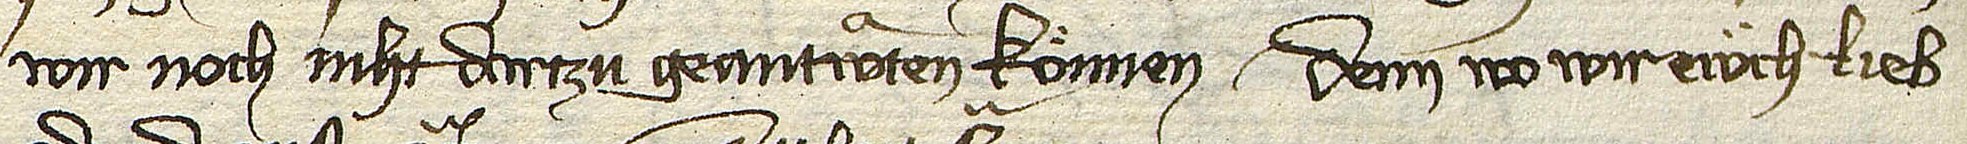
wir noch niht darcʒu geantw*ten können / Denn wo wir ewch lieb
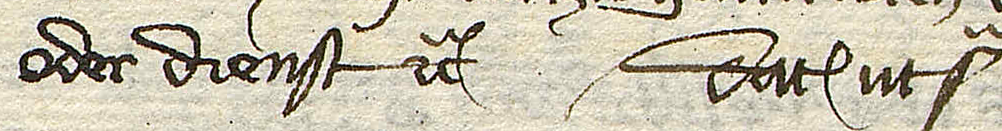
oder dienſt ec* / Dat* ut ſ*
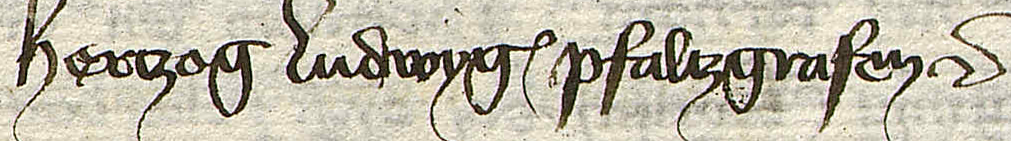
hercʒog ludwyg* pfalcʒgrafen ec*
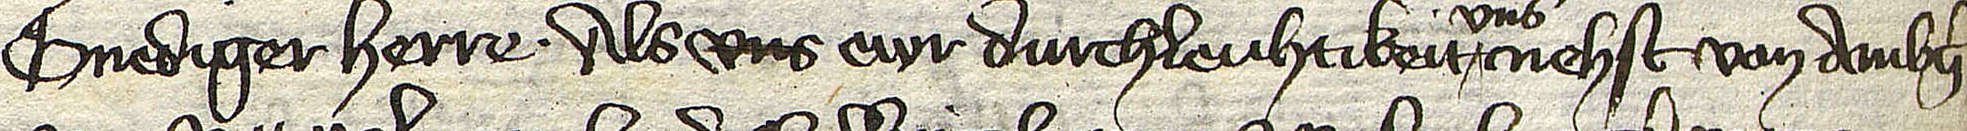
Gnediger herre . Als vns ewr durchleuhtikeit nehſt von Amb*g
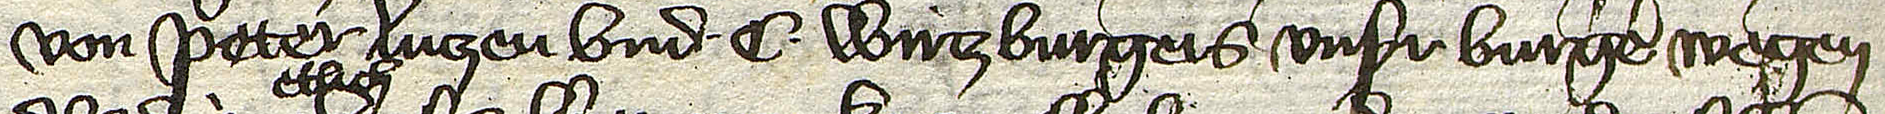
von peter lucʒen vnd . C . Wircʒburgers vnſ*r burge* wegen
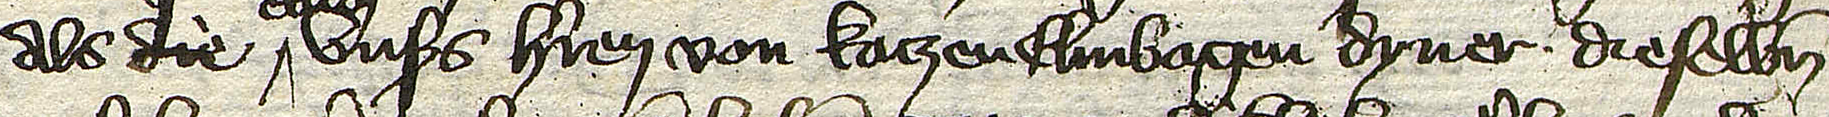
Als die vnſ*s h*ren von kacʒen Elmbogen dyner . dieſelb*n
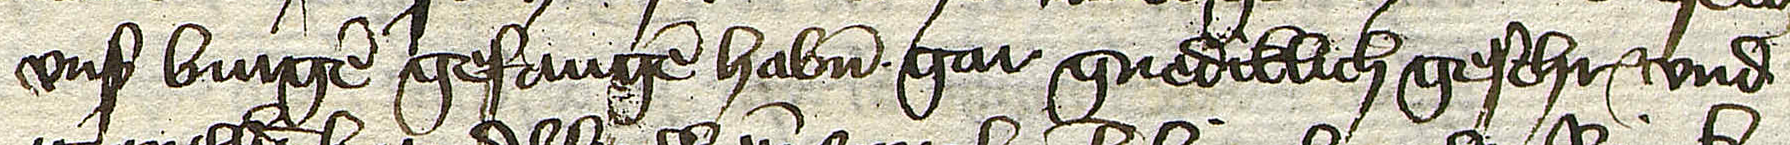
vnſ* burge* gefange* hab*n . gar gnediklich geſchr* vnd
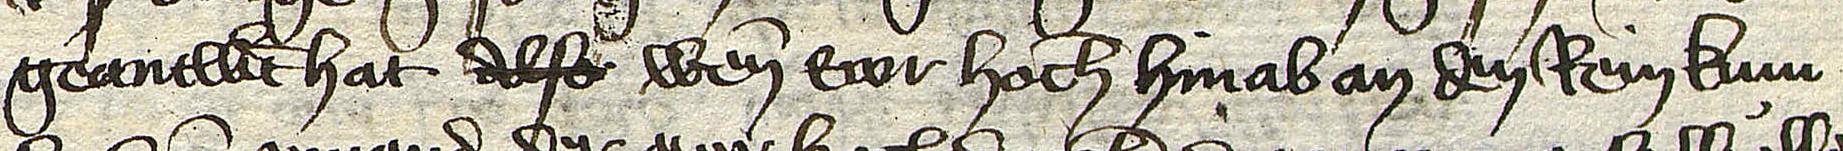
geantw*t hat . Alſo wen* ewr hoch* hinab an den Rein kum
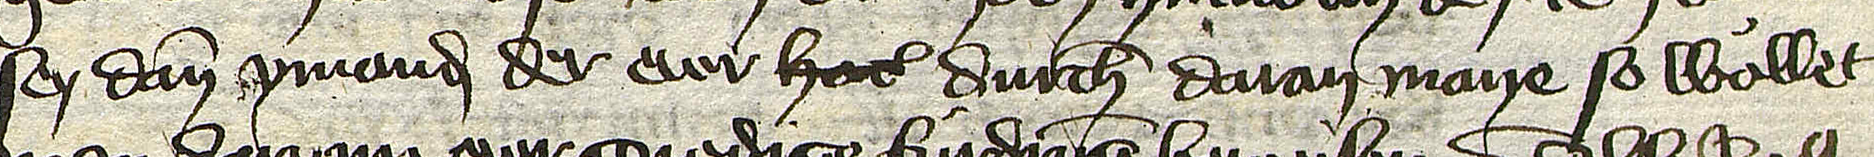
ſey dan* ymand* der ewr hoc durch* daran mane ſo wöllet
